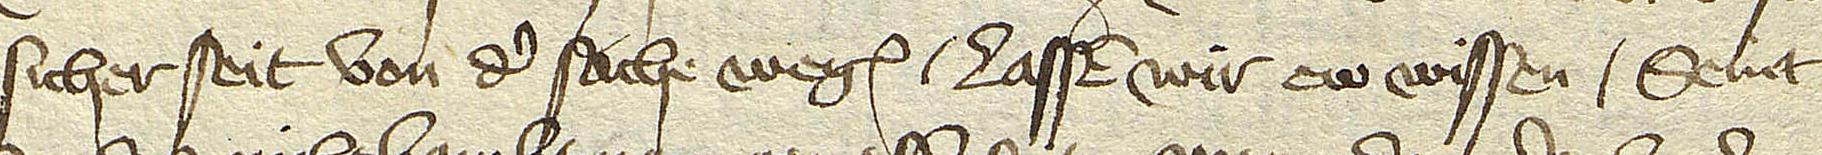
ſicher ſeit von d* ſache weg* / Laſſe* wir ew wiſſen / Seint
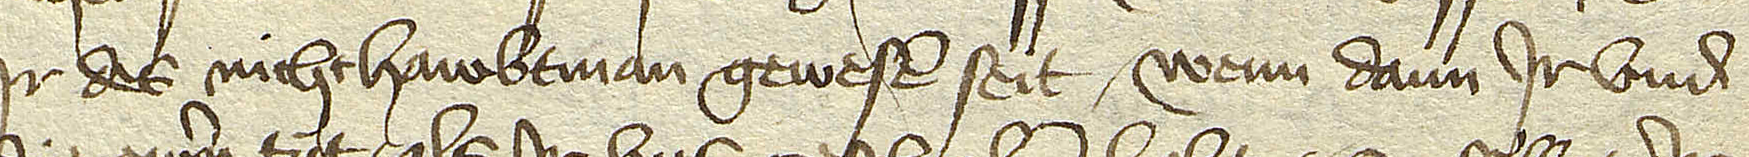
Ir des nicht hawbtman geweſe* ſeit / wenn dann Ir vnd
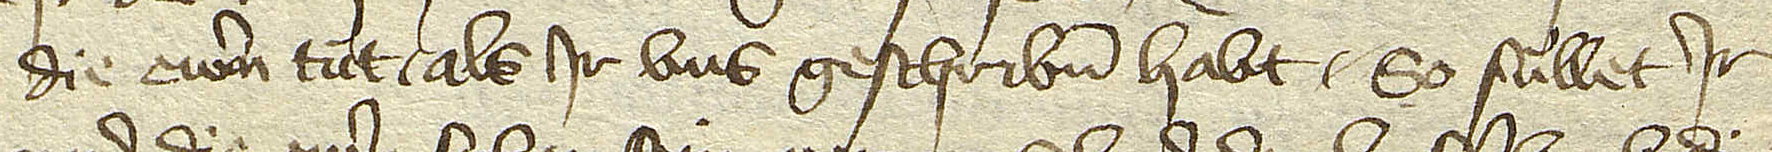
die ew*n tut / als Ir vns geſchribn* habt / So ſüllet Ir
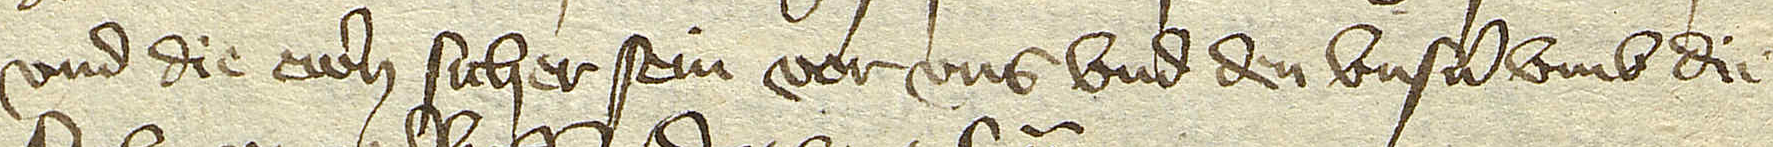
vnd die ew*n ſicher ſein vor vns vnd den vnſn* vmb die
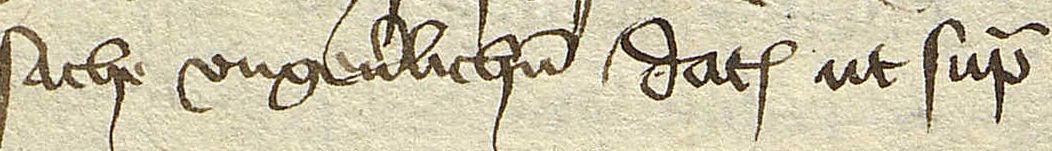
ſache vngeu*lichn* / dat* ut ſup*
